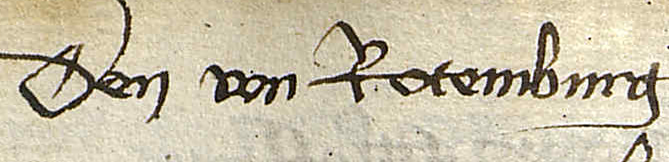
Den von Rotemburg
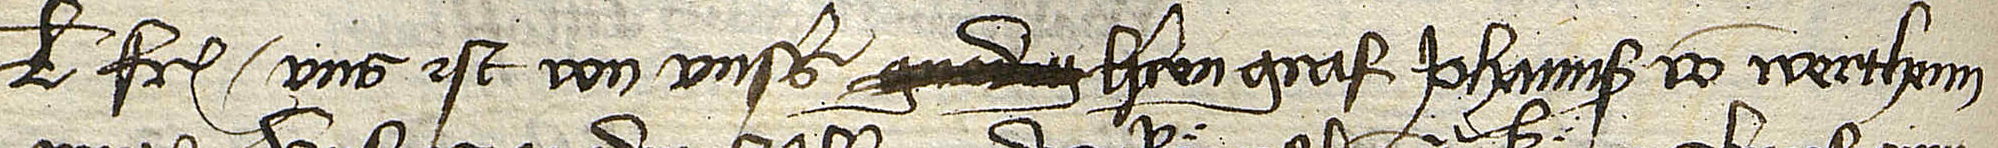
L* fr* / vns iſt von vnſ*s gnedig h*ren graf Iohannſ* vo* wertheim
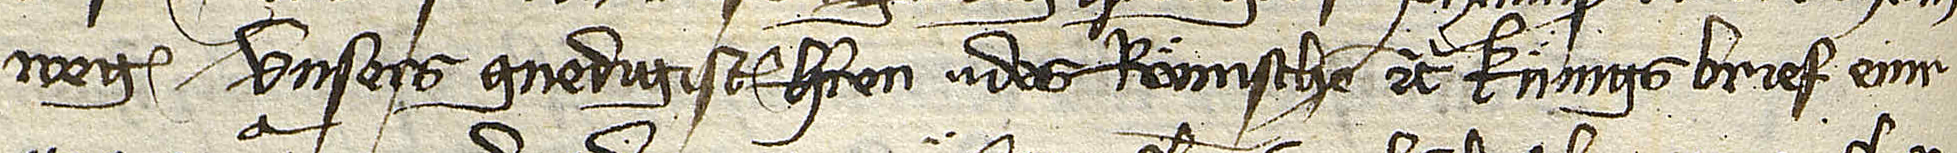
weg* / Vnſers gnedigiſt* h*ren ~ des Römſche* ec* künigs brief einr
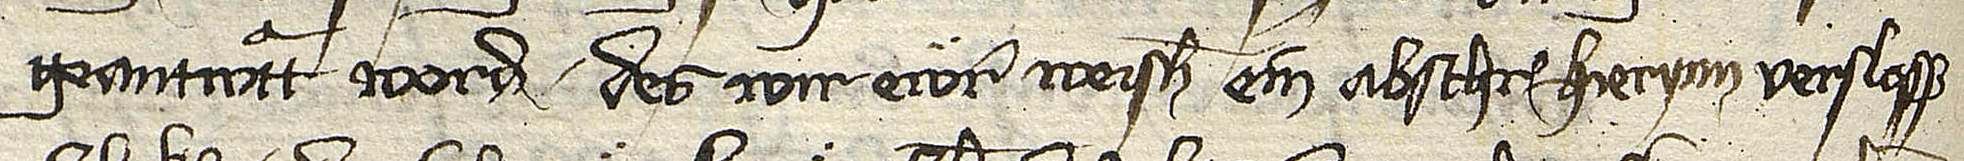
geantw*tt word* / Des wir eẅr* weiſh* ein abſchr* hierynn verſloſſ*
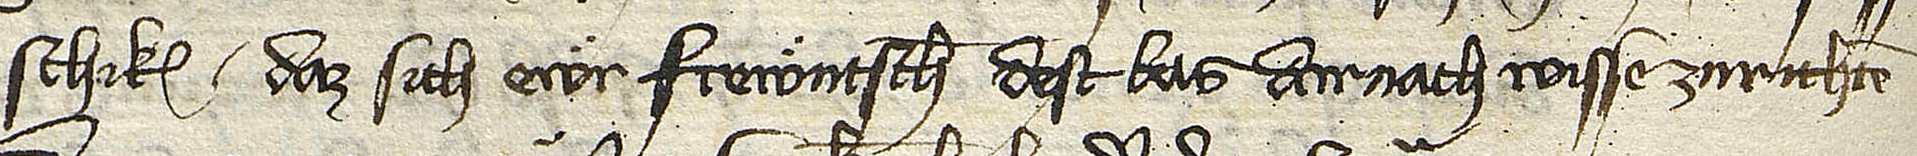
ſchik* / daʒ ſich eẅr freẅntſch* deſt bas darnach wiſʒe ʒurichte*
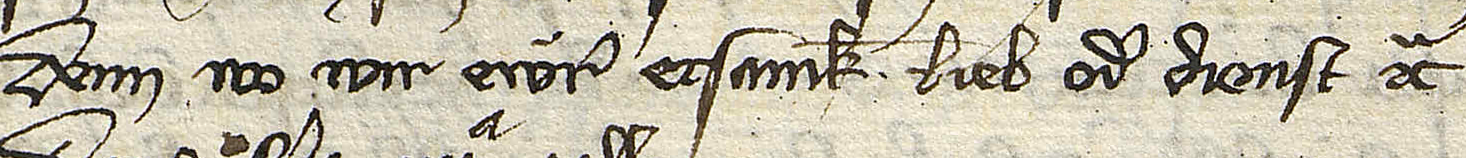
Denn wo wir eẅr* erſamk* . lieb od* dienſt ec*
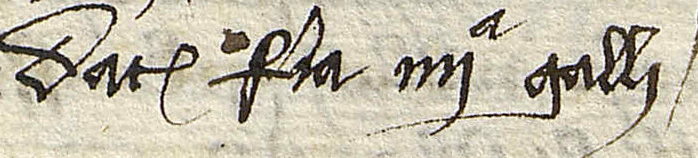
Dat* fi*a iiii* galli
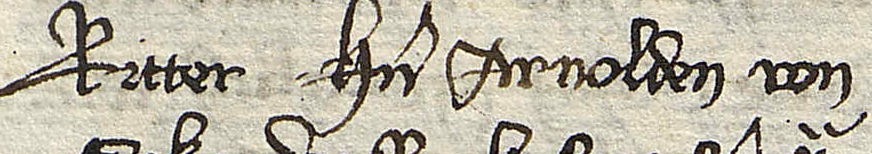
Ritter / Hn* Arnolden von
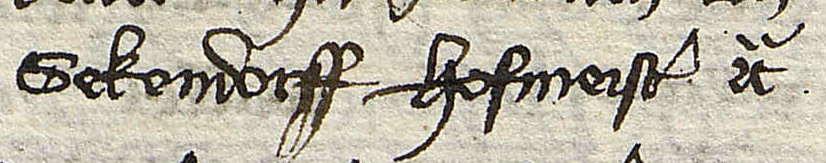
Sekendorff Hofmeiſt* ec*
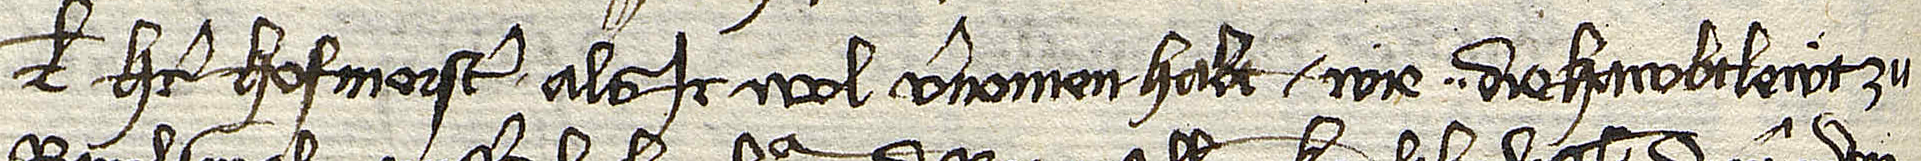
L* Hr* hofmeiſt* / als Ir wol v*nomen habt / wie ~ die hawbtleẅt ʒu
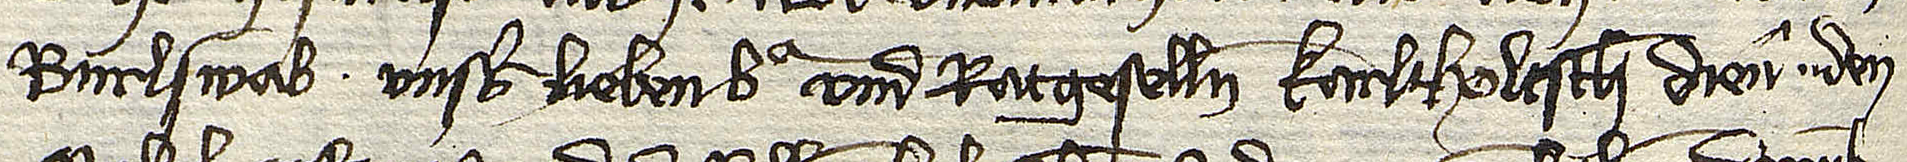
Burlſwab . vnſ*s lieber b* vnd Ratgeſelln* karl holtſch* dien* ~ den
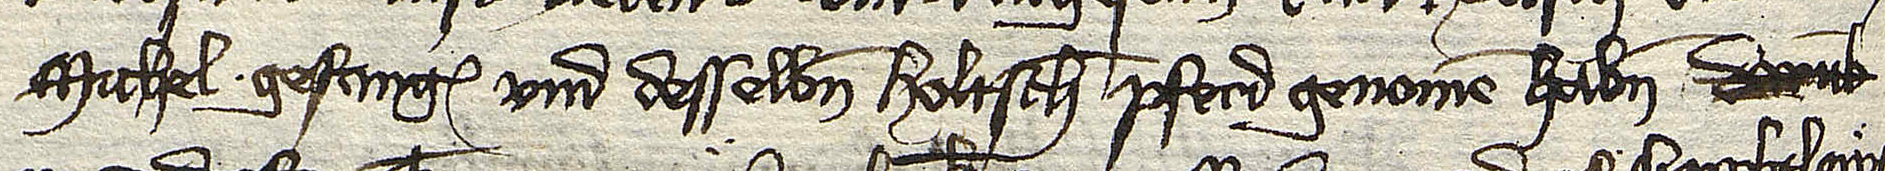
Michel . gefang* vnd deſſelbn* holtſch* pferd genome* habn* / Darub*
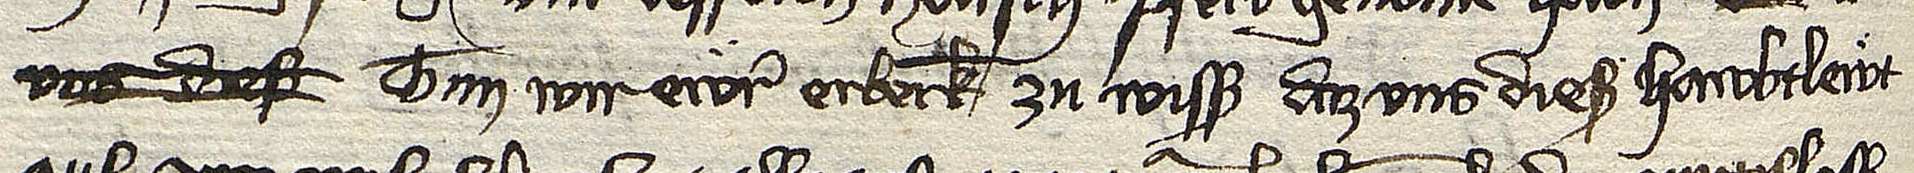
vns dieſ* Tun wir eẅr* erberk* ʒu wiſſ* daʒ vns dieſ* hawbtleẅt
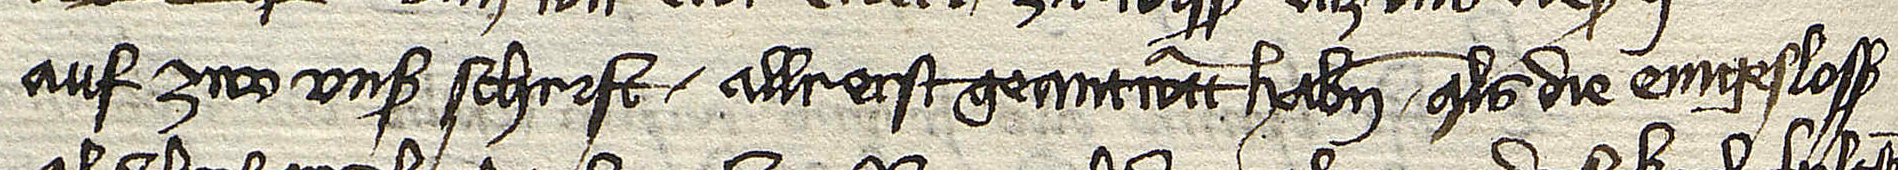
auf ʒwo vnſ* ſchrift / allrerſt geantw*tt habn* / als die eingeſloſſ*
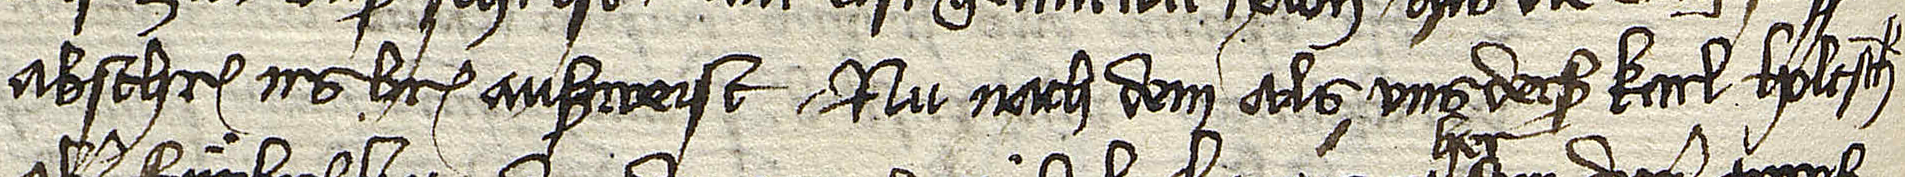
abſchr* irs br* auſʒweiſt / Nu nach dem als vns derſ* karl holtſch*
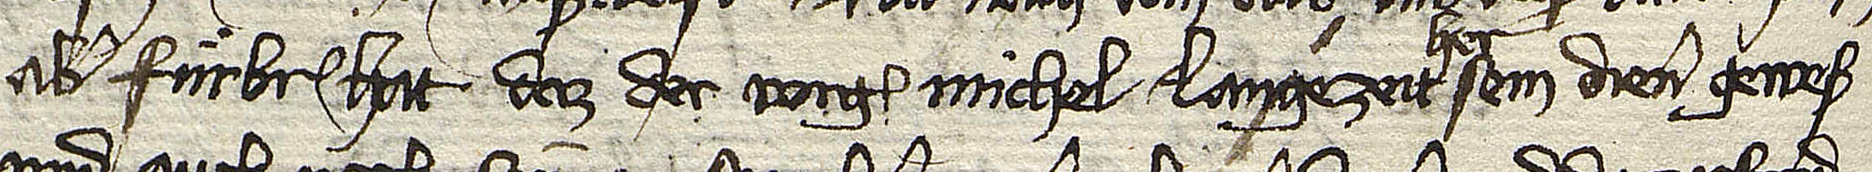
ab* fürbr* hat . daʒ der vorg* michel / langeʒeit ſein dien* geweſ*
